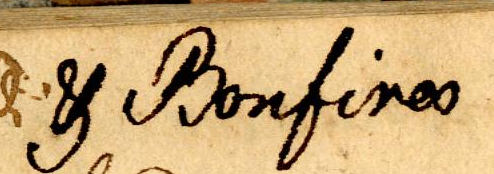& Bonfires
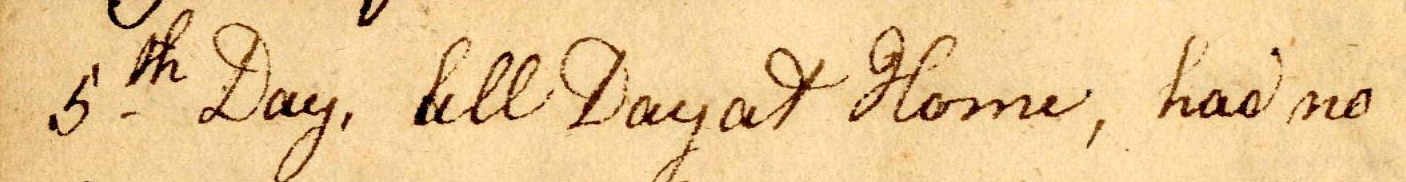5^th Day, all Day at Home, had no
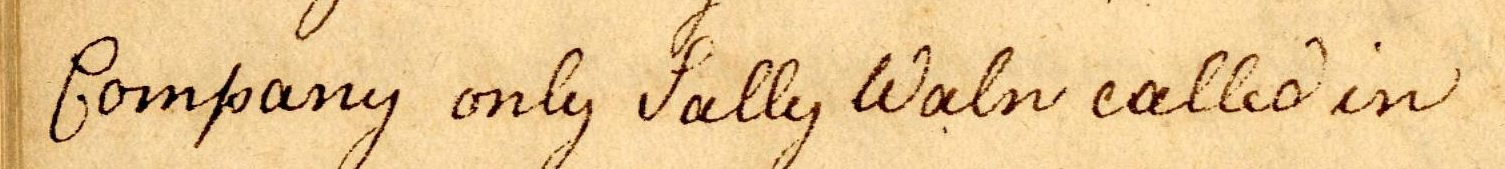Company only Sally Waln called in
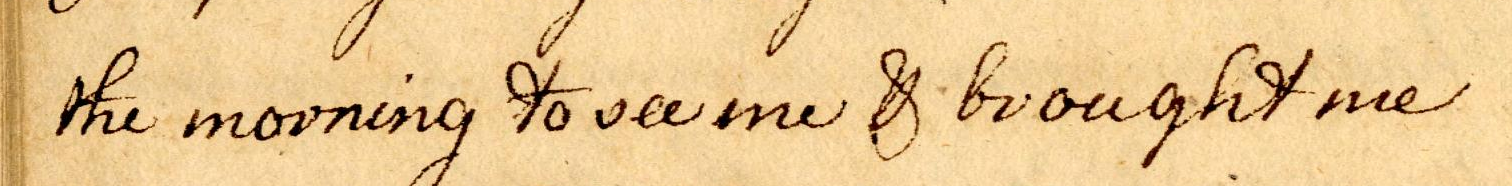the morning to see me & brought me
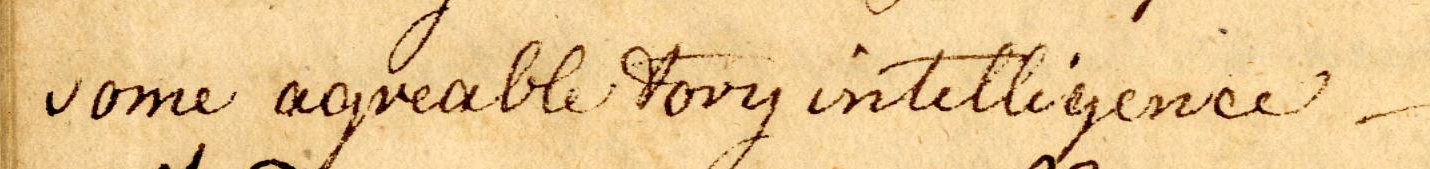some agreable tory intelligence-
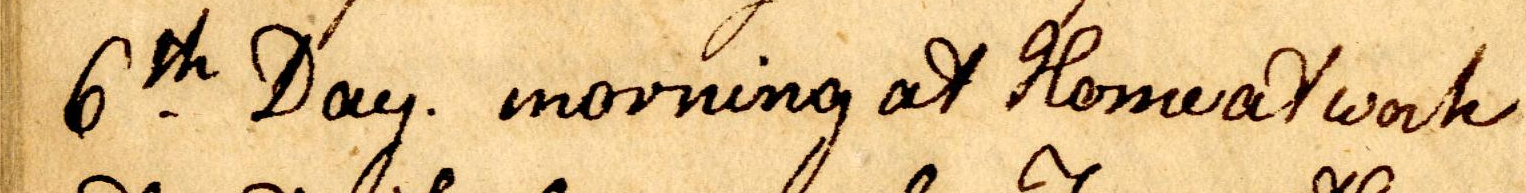6^th Day. morning at Home at work
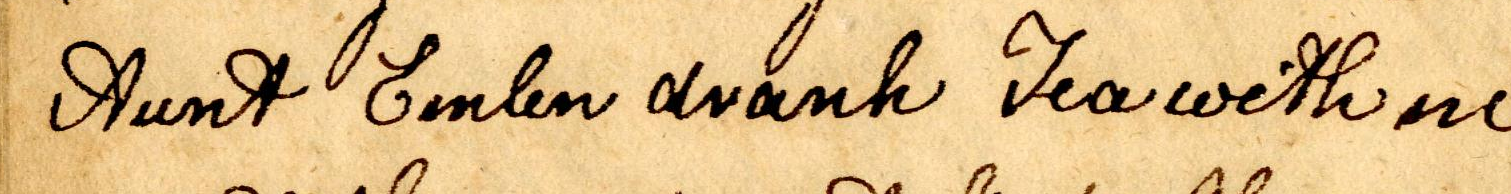Aunt Emlen drank Tea with me
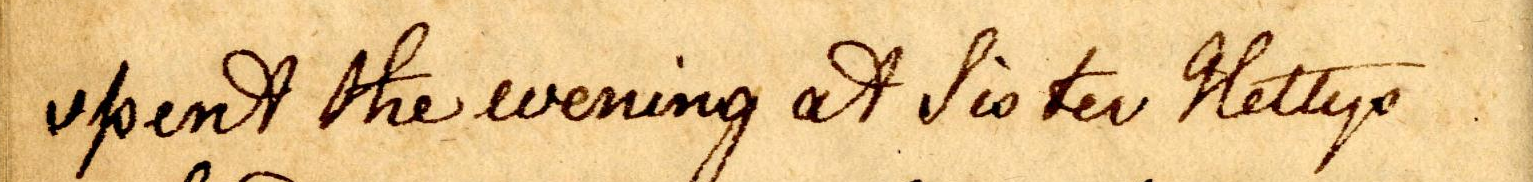spent the evening at Sister Hettys
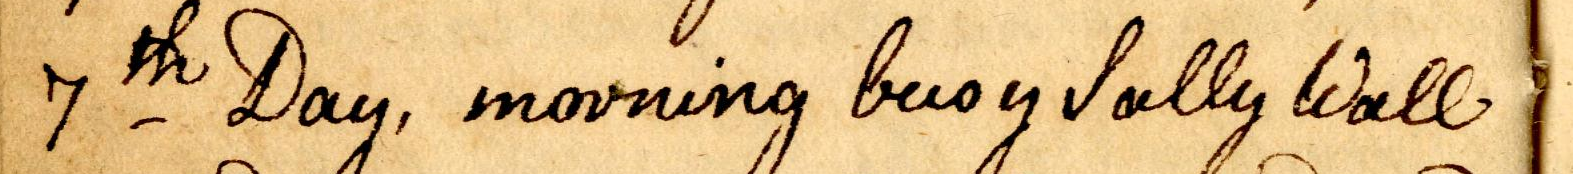7^th Day, morning busy Sally Wall
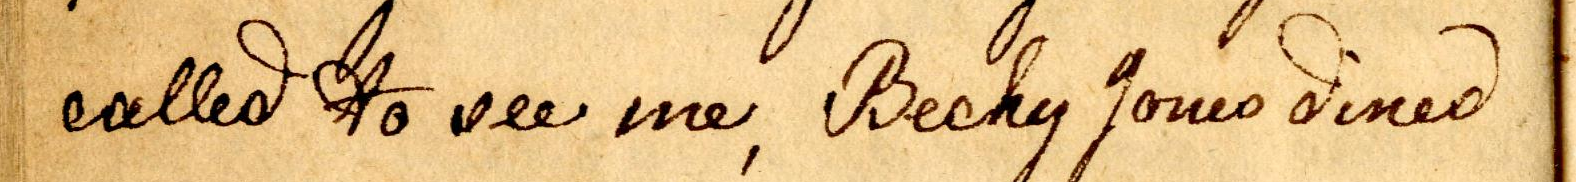called to see me, Becky Jones dined
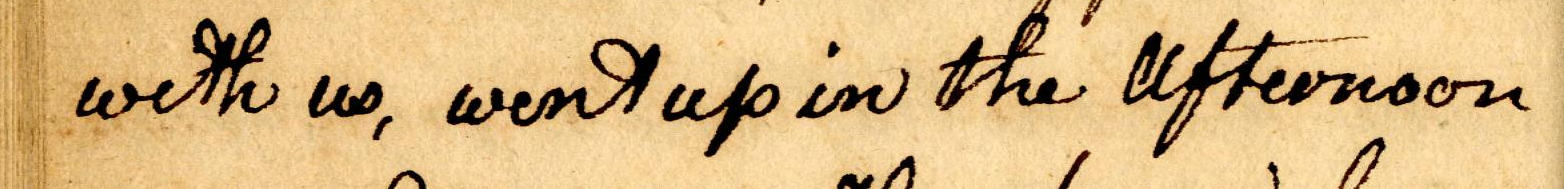with us, went up in the afternoon
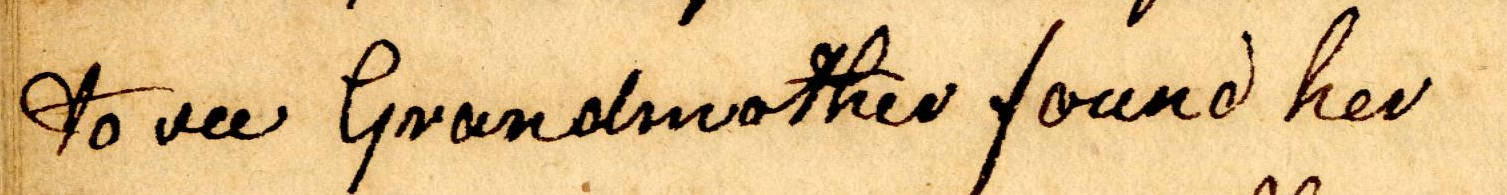to see Grandmother found her
